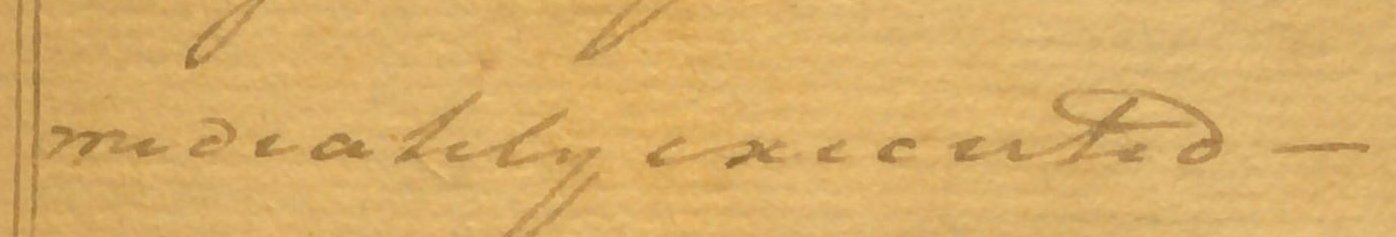mediately executed-
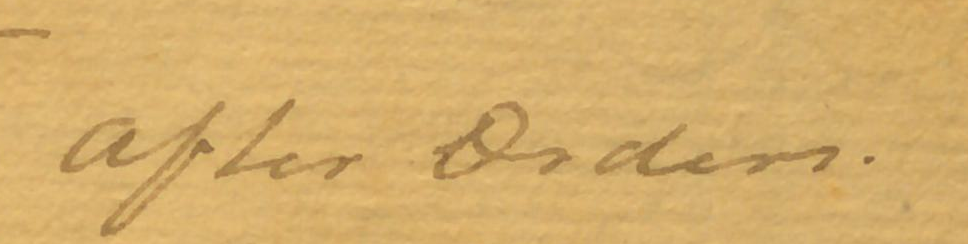After Orders.
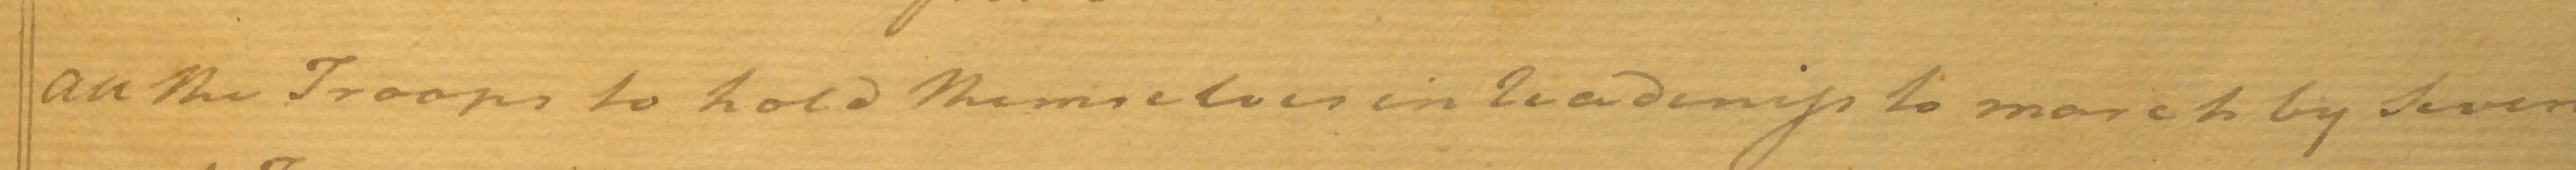All the Troops to hold themselves in readiness to march by seven
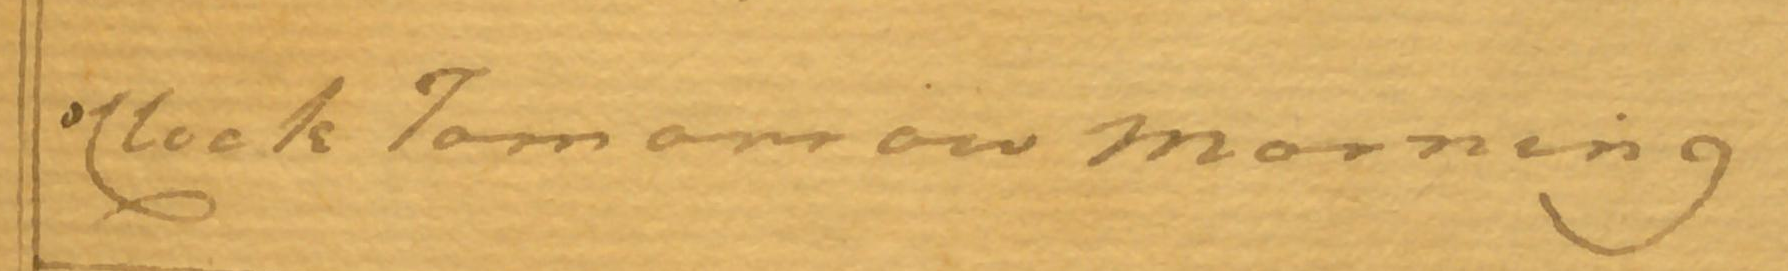^oClock Tomorrow morning
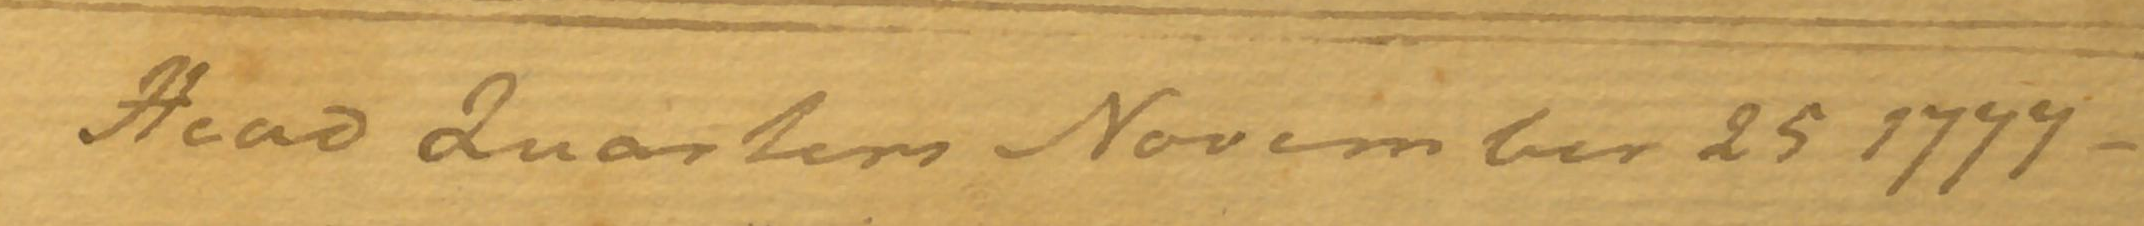Head Quarters November 25 1777
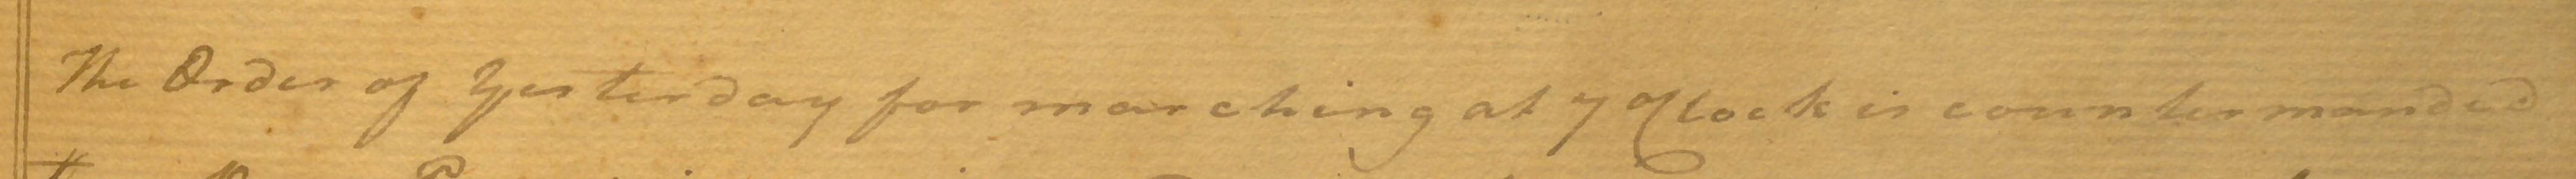The Orders of yesterday for marching at 7 ^oClock is countermanded
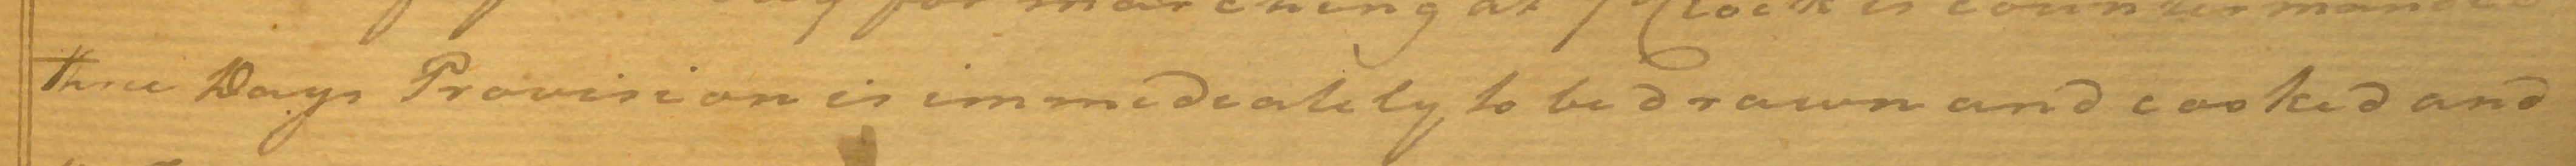two Days Provisions is immediately to be drawn and cooked and
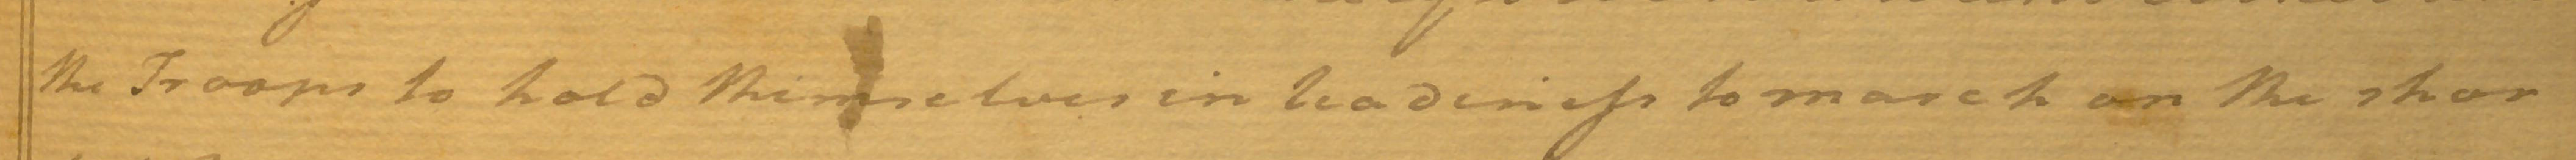the Troops to hold themselves in readiness to march on the shor
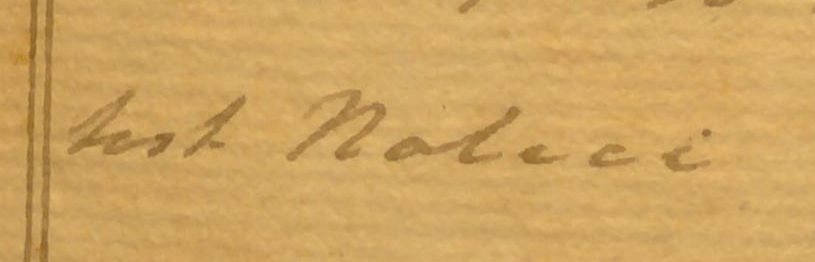test Notice
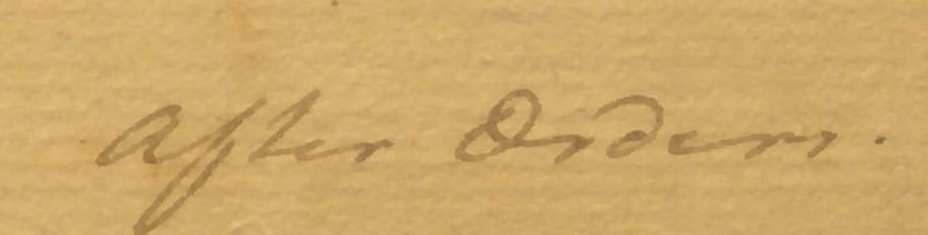after Orders.
